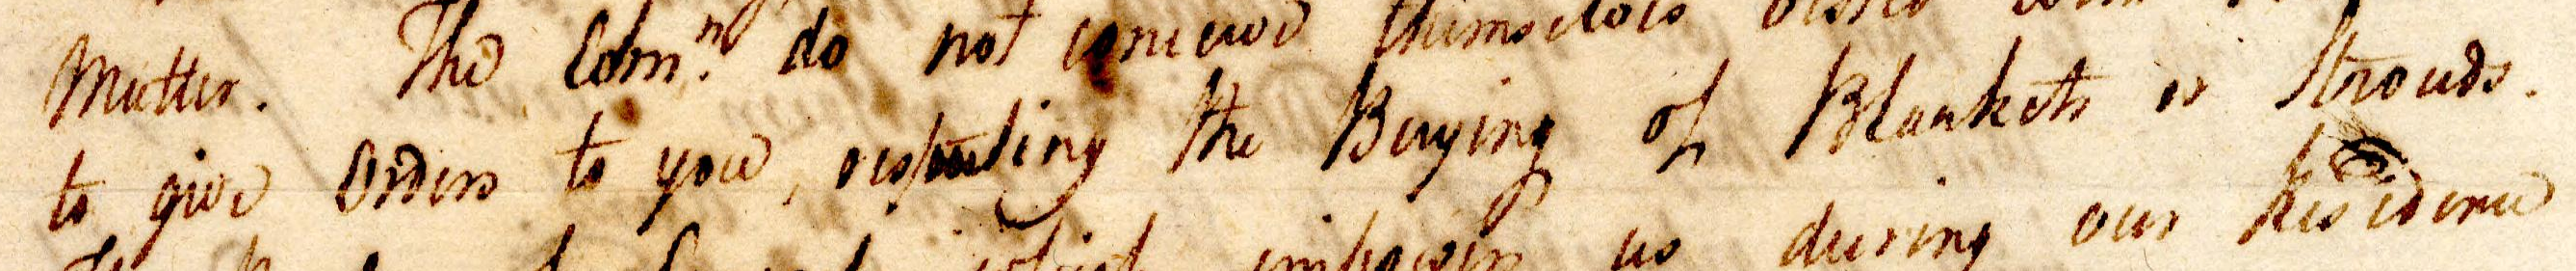to give Orders to you restarting the Buying of Blankets or Strouds.
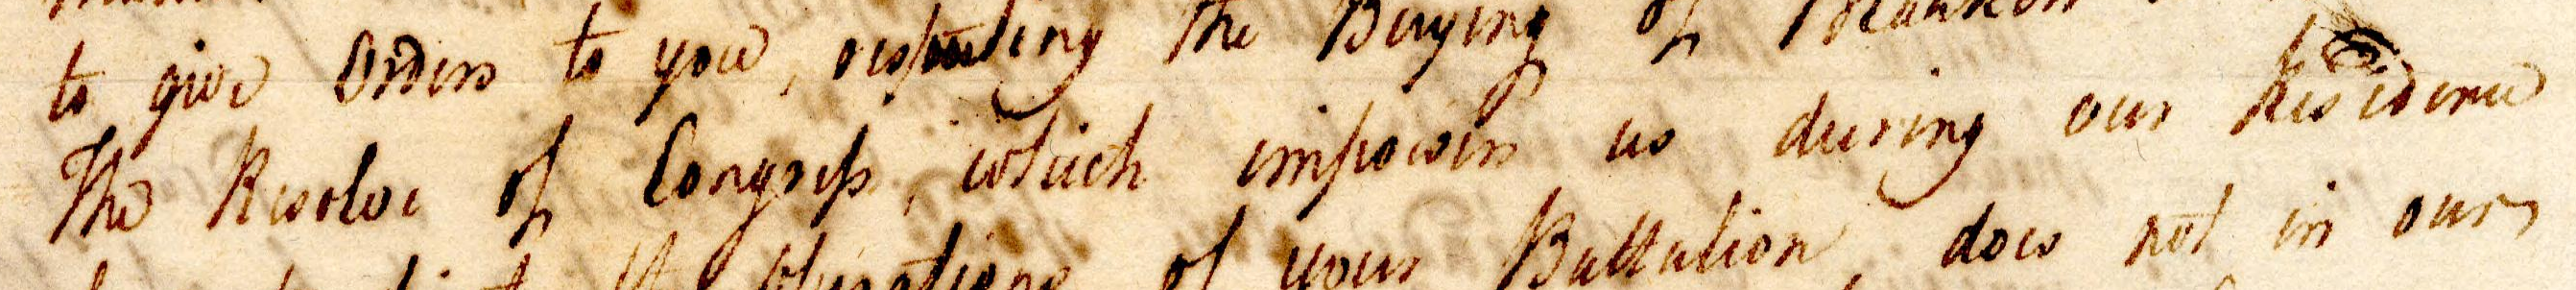The Resolve of Congress which impowers us during our Residence
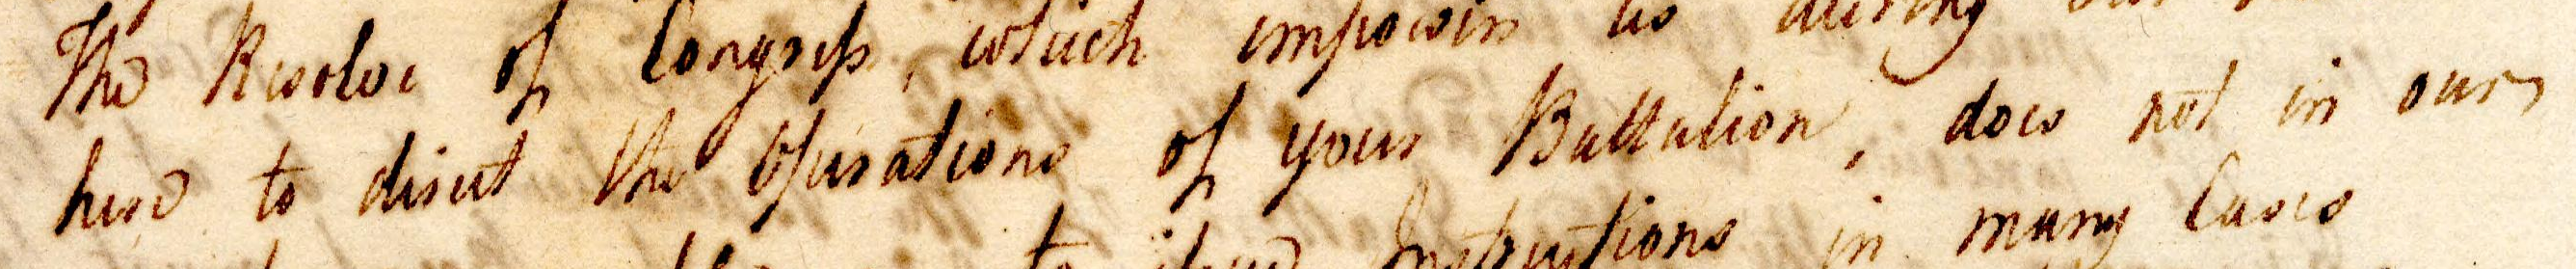here to direct the Operations of your Battalion, does not in our
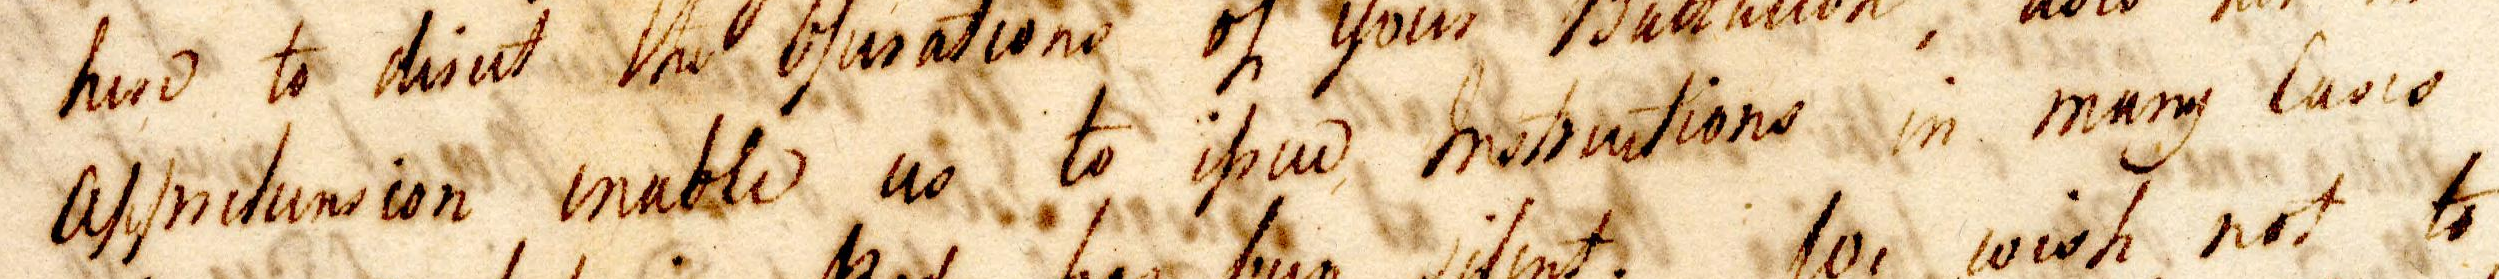Apprehension enable us to issue Instructions in many Cases
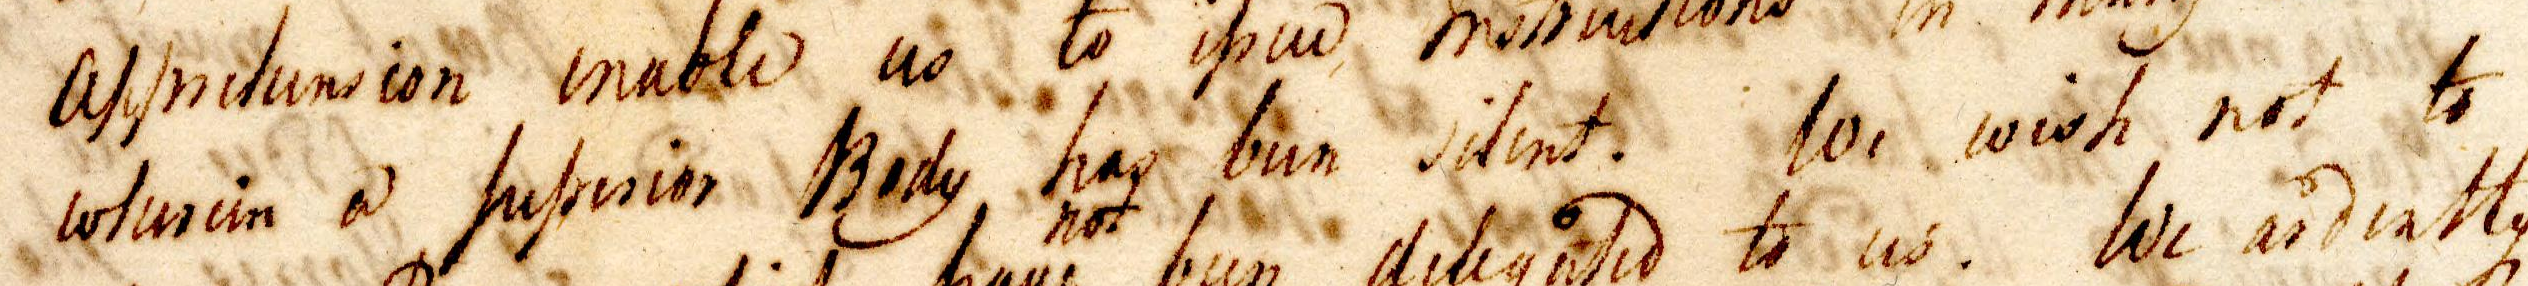wherein a superior Body has been silent. We wish not to
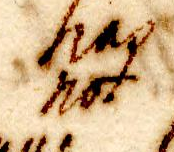not
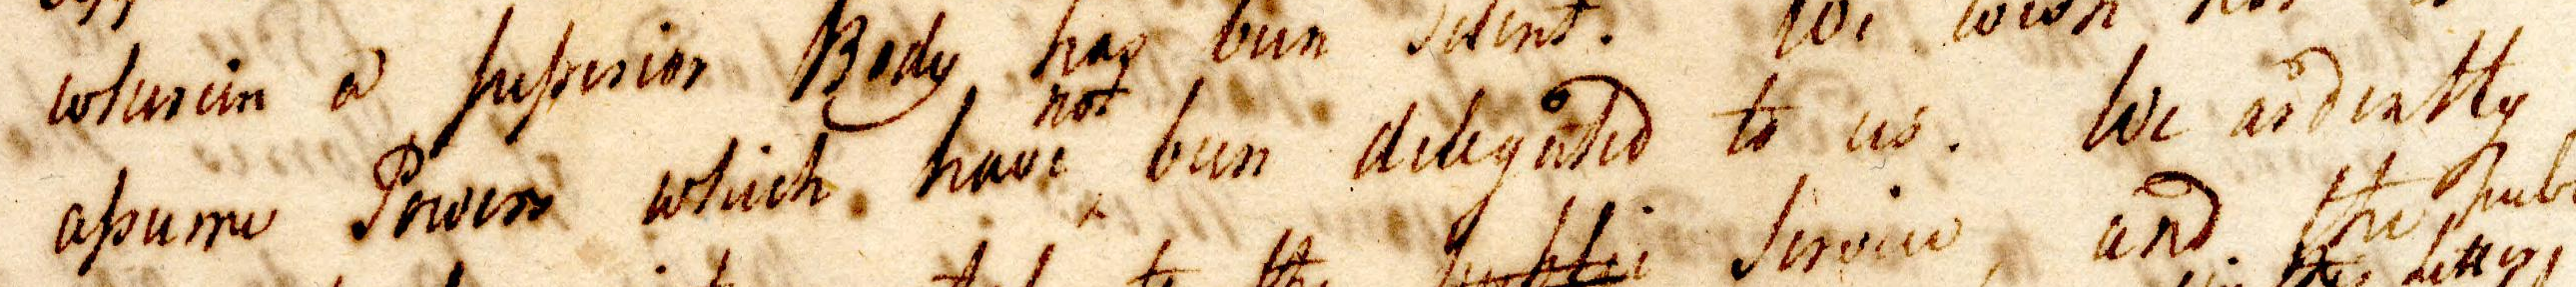assume Powers which have ^ been delegated to us. We ardently
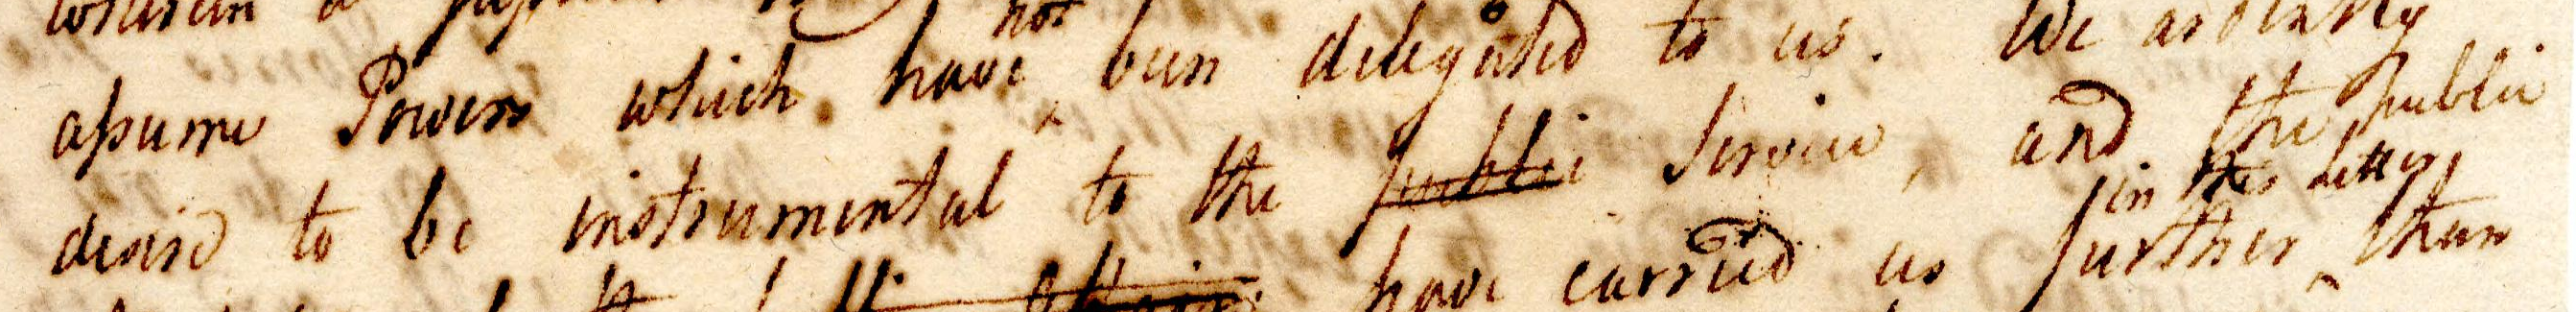desire to be instrumental to the public Service, and the public
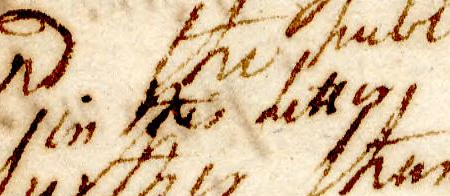in this Letter
